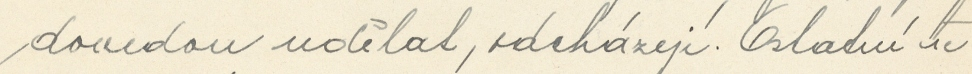dovedou udělat, odcházejí. Ostatní tu
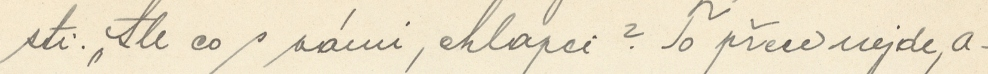sti. „Ale co s vámi, chlapci? To přece nejde, a-
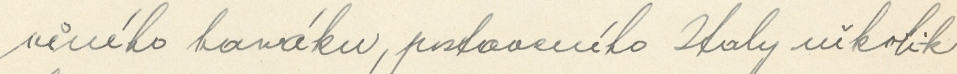věného baráku, postaveného Italy několik
